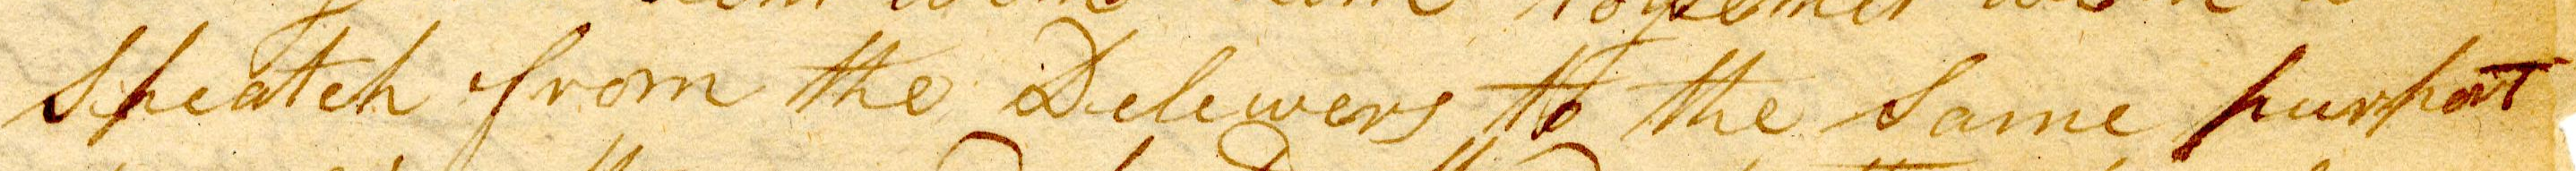Speatch from the Delewers to the Same purpose
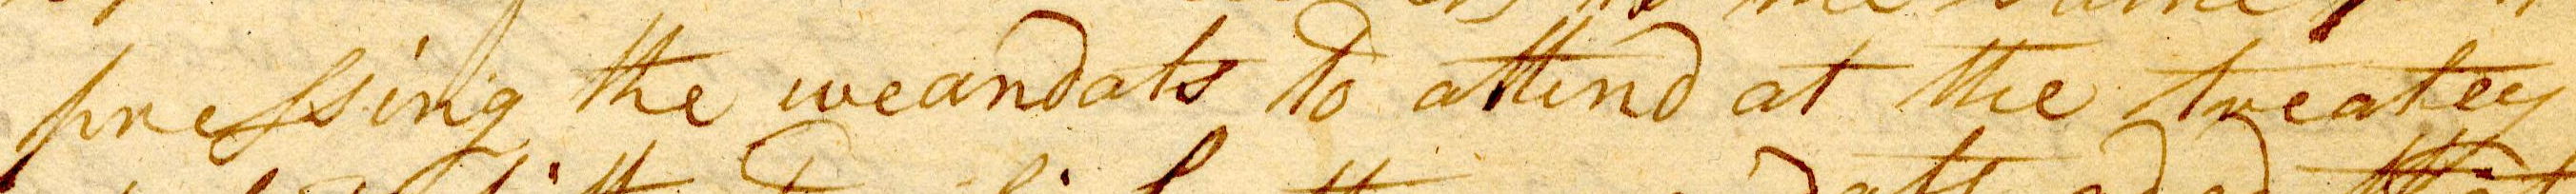pressing the weandats to attend at the treatey
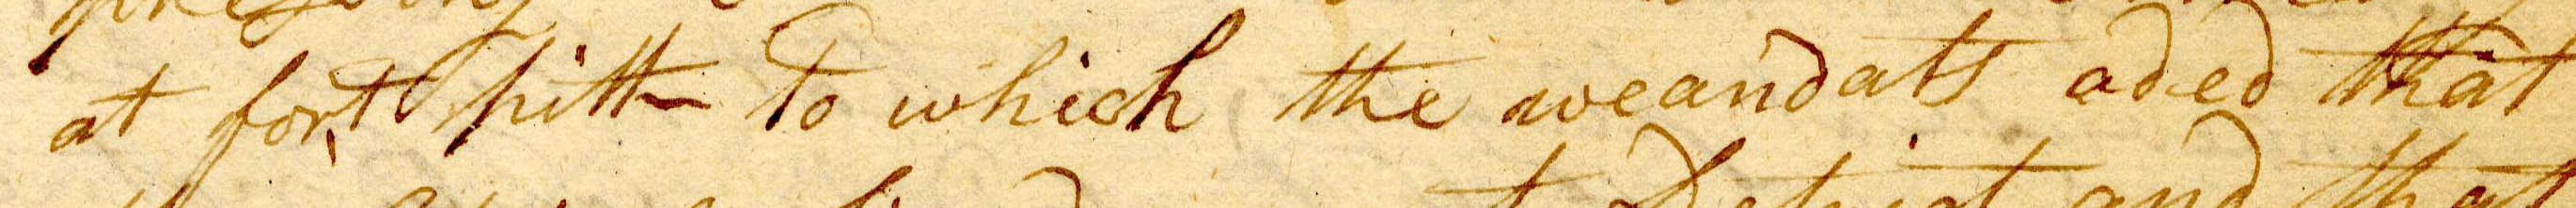at fort pitt to which the weandats aded that
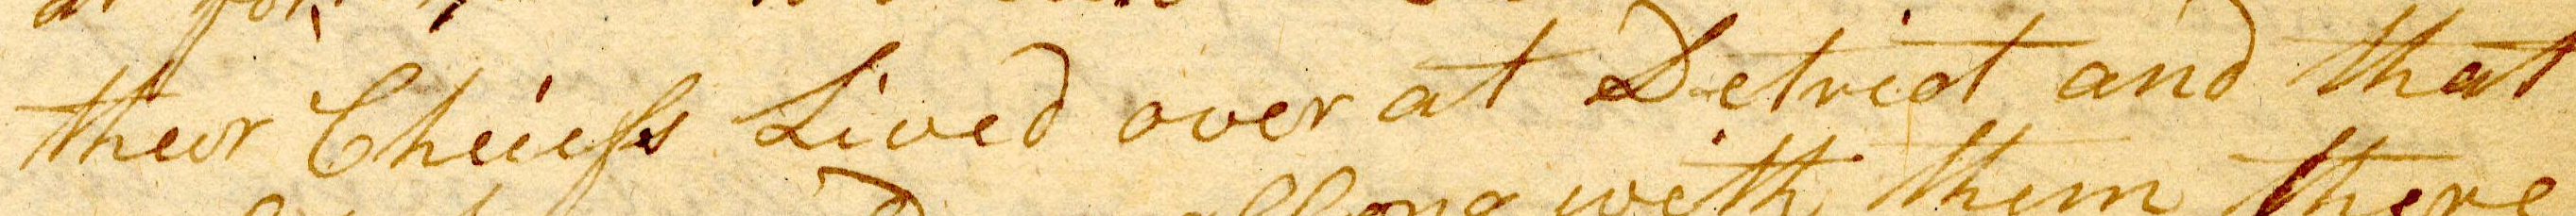their Chiefs Lived over at Detroit and that
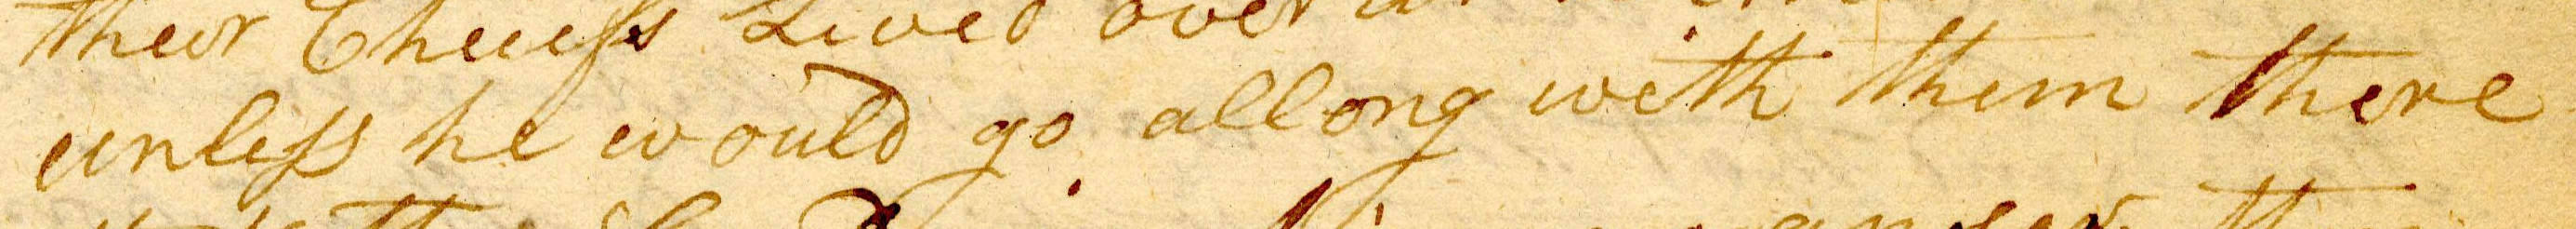unless he would go allong with them there
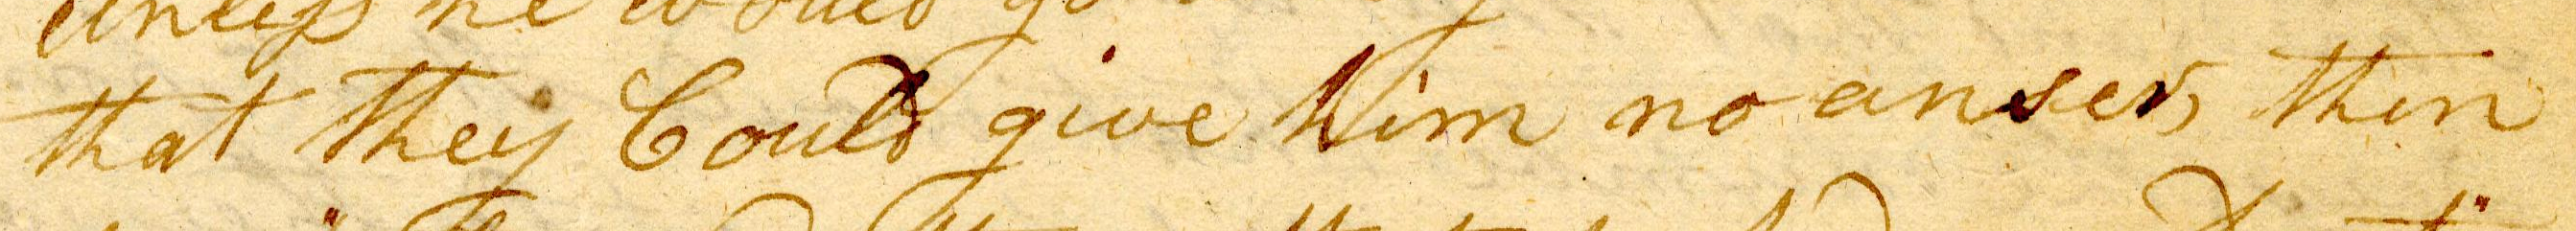that they Could give him no anser than
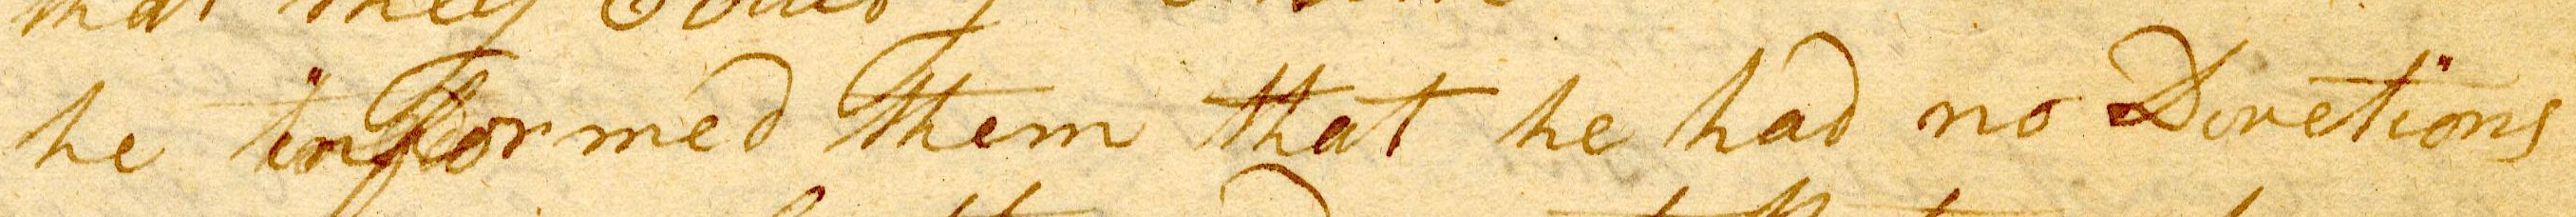he informed them that he had no Directions
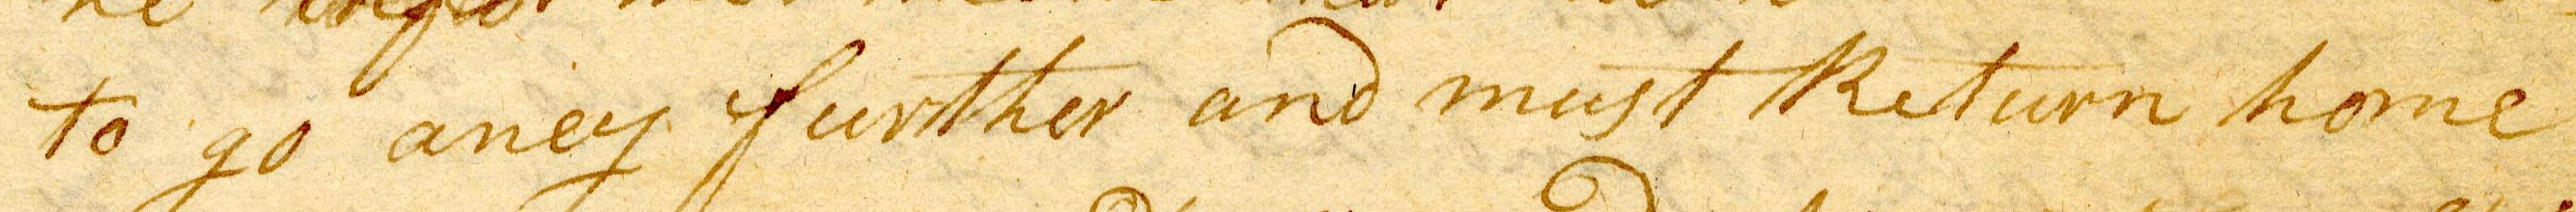to go aney further and must Return home
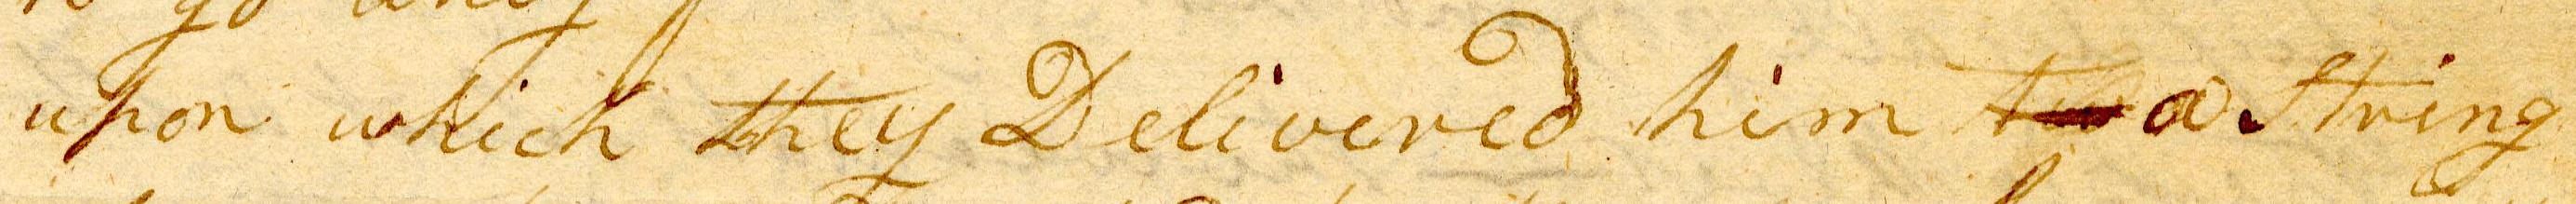upon which they Delivered him two a String
